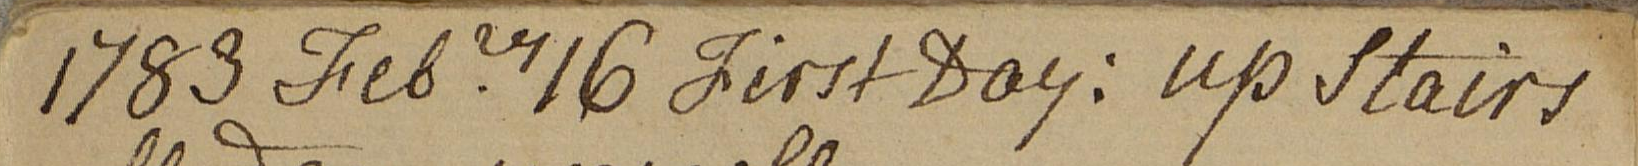1783 Feb^ry 16 First Day: up Stairs
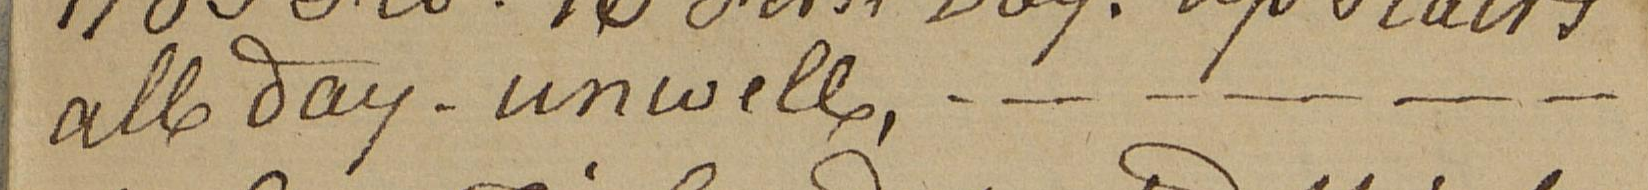all day, unwell,-----
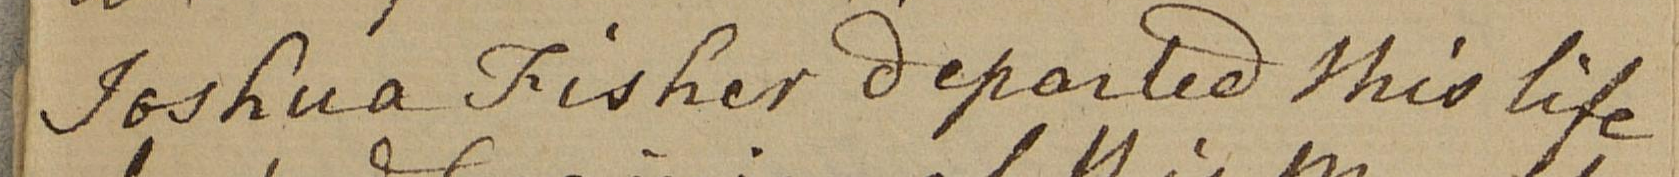Joshua Fisher departed this life
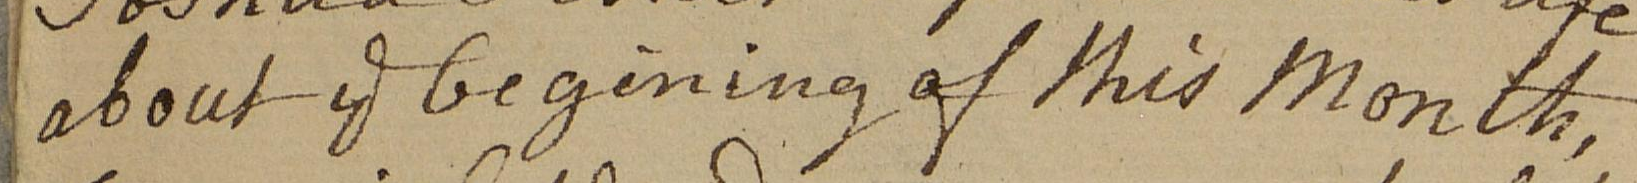about y^e begining of this month,
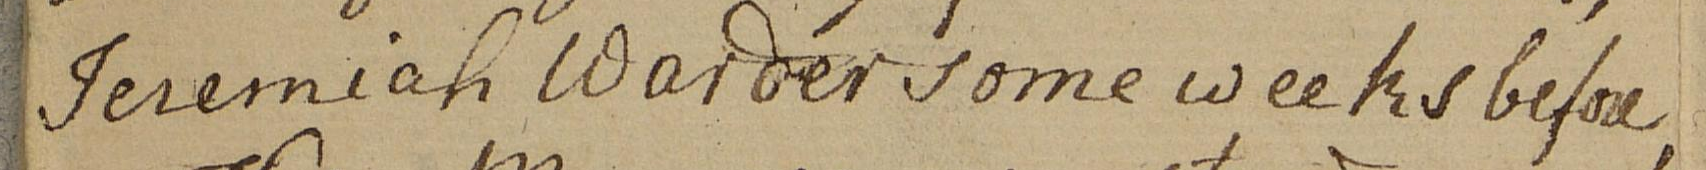Jeremiah Warber some weeks before,
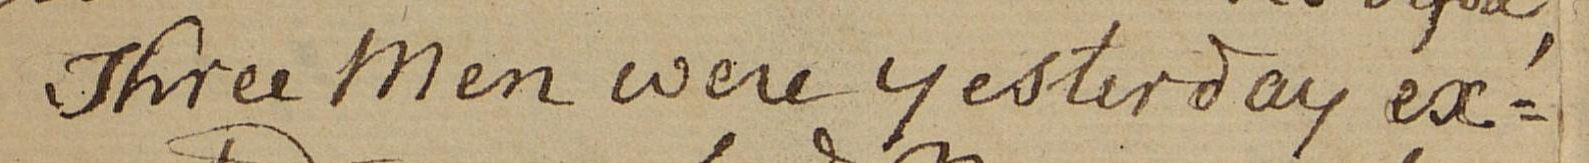Three Men were yesterday ex-
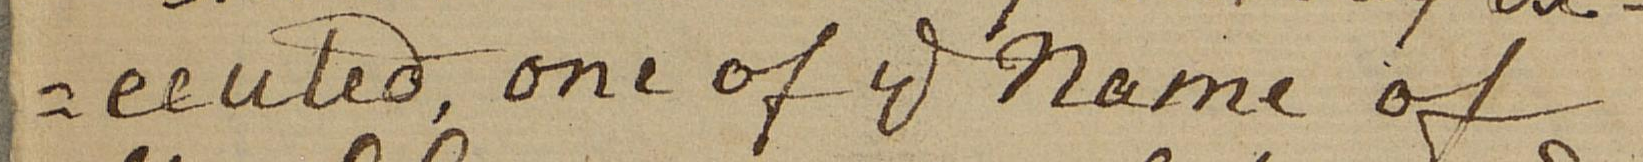-ecuted, one of y^e name of
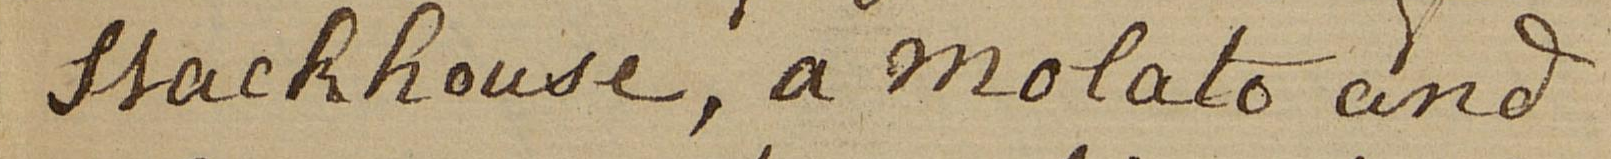Stackhouse, a molato and
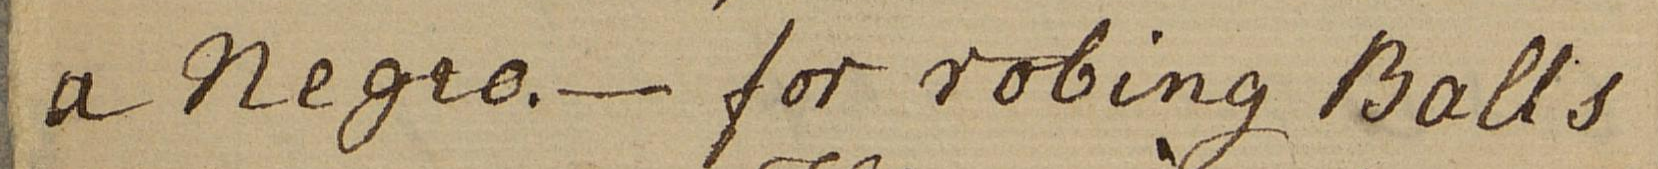a Negro.- for robing Balls
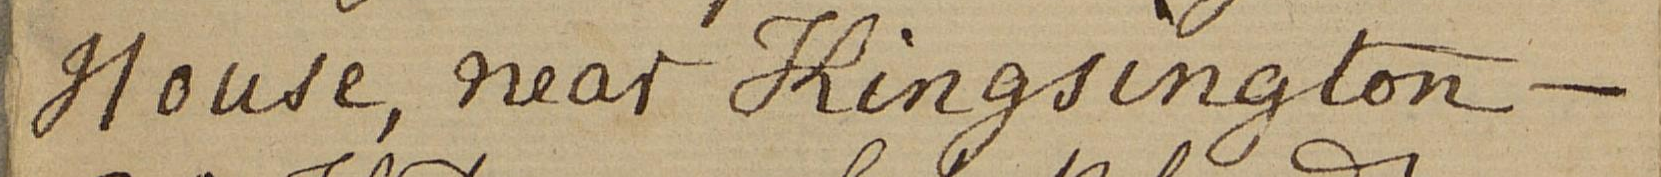House, near Kingsington-
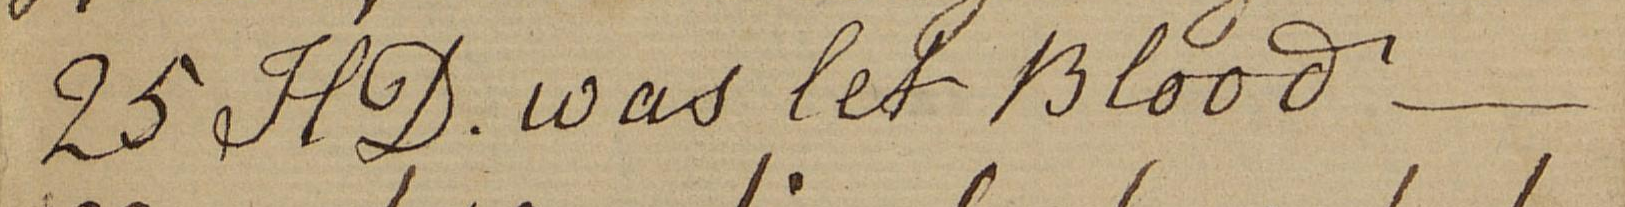25 HD. was let Blood-
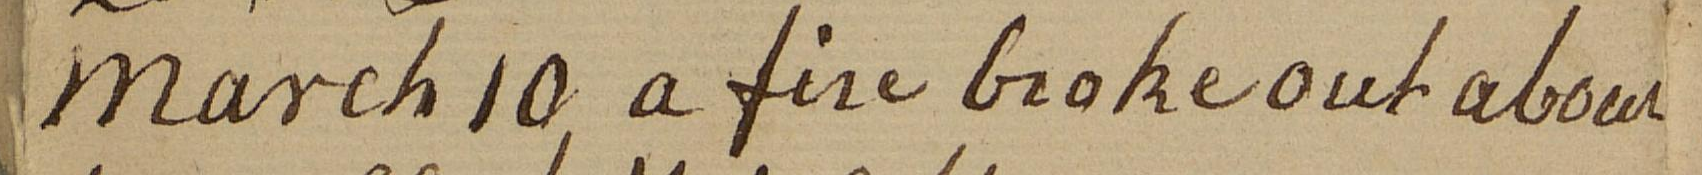March 10 a fire broke out about
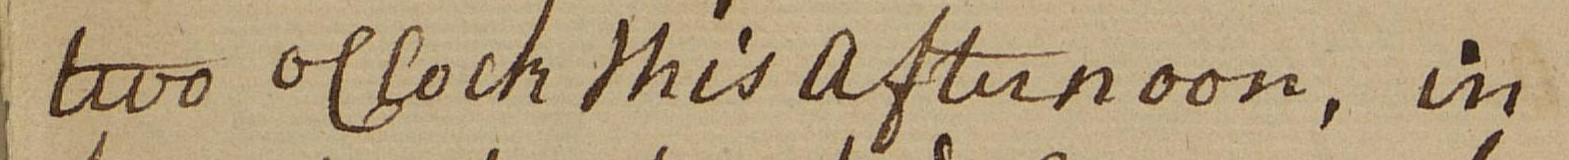two ^o Clock this Afternoon, in
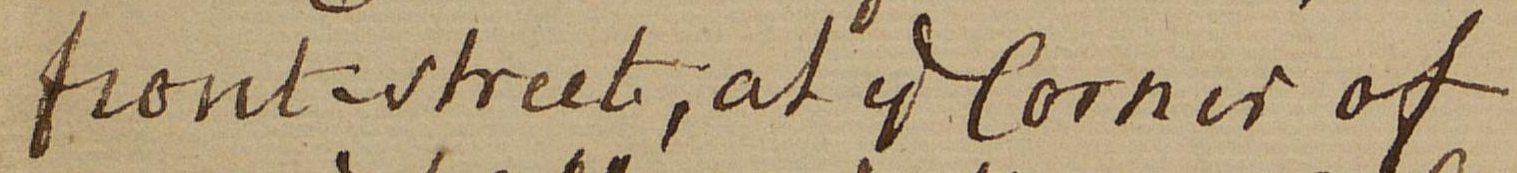front-street, at y^e Corner of
